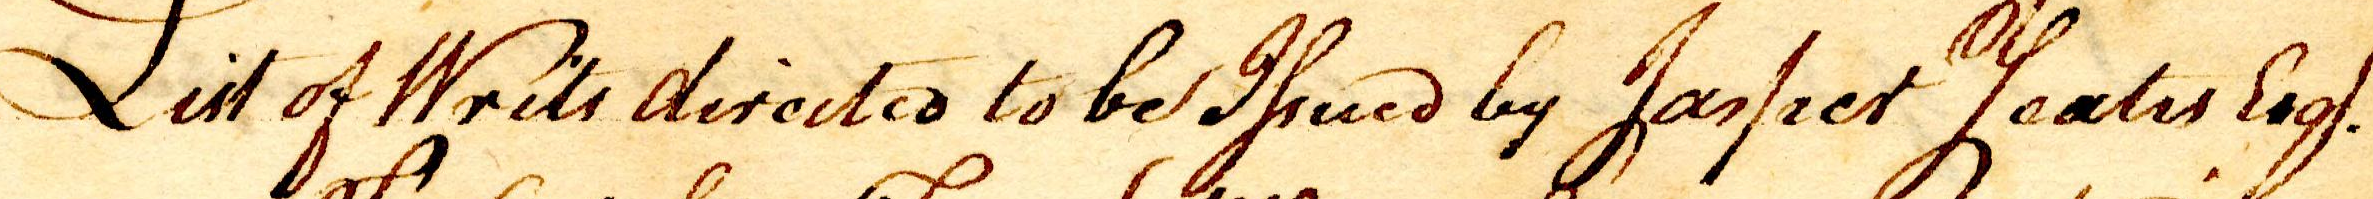List of Writs directed to be Issued by Jasper Yeates Esq^r.
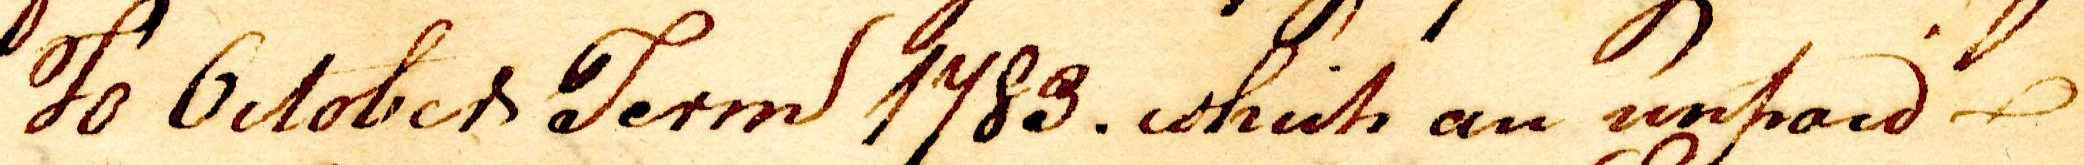To October Term 1783. which are unpaid
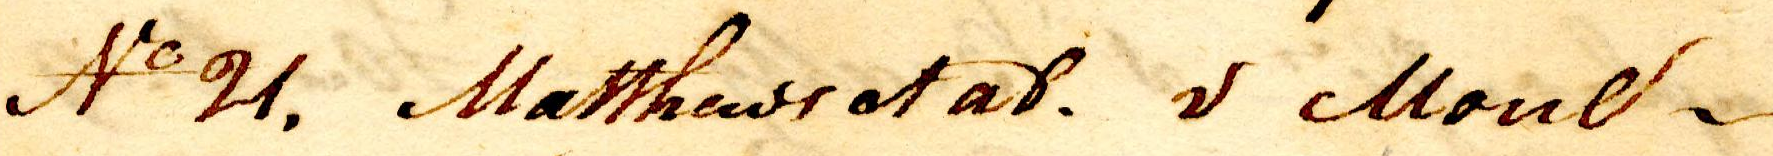N^o 21. Matthews et al. v Moul
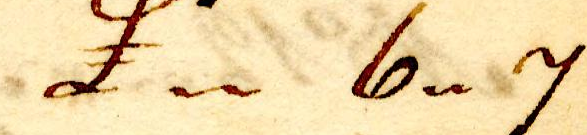£ .6. 7
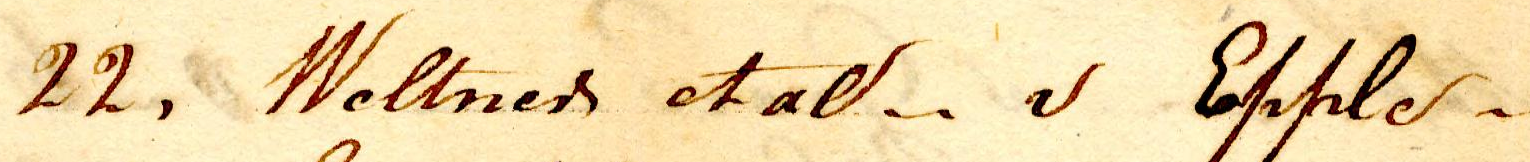22. Weltner et al v Epple
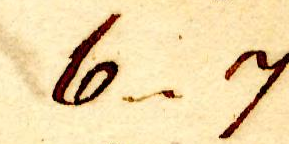6.7
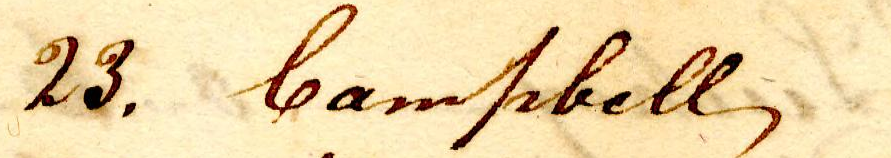23. Campbell
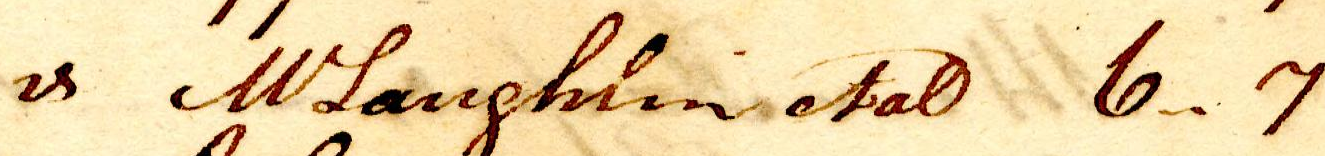M^cLaughlin et al 6.7
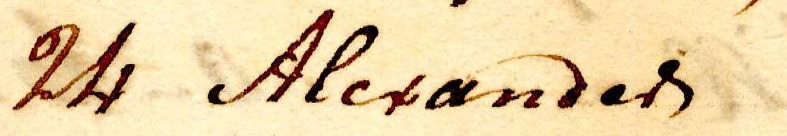24 Alexander
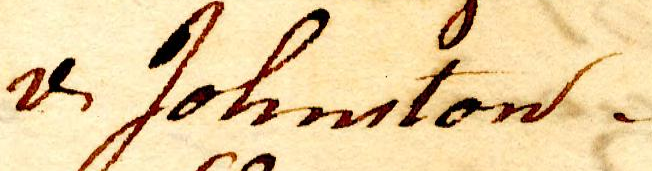Johnston
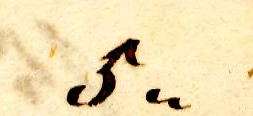5.7
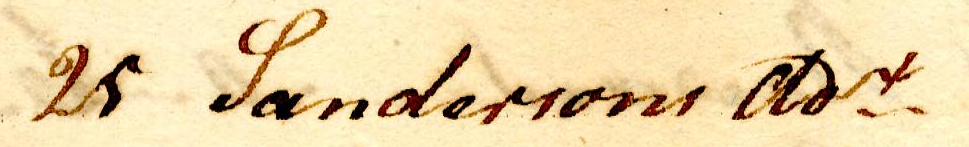25 Sandersons do^t
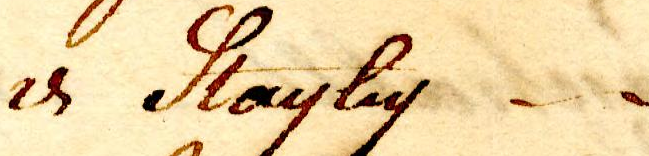v Stayly-
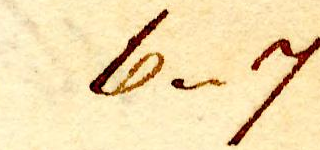6.7
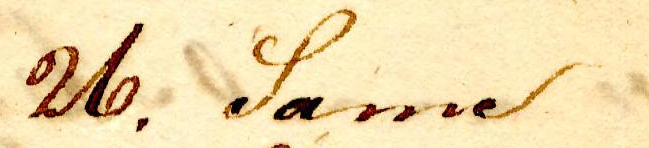26. Same
